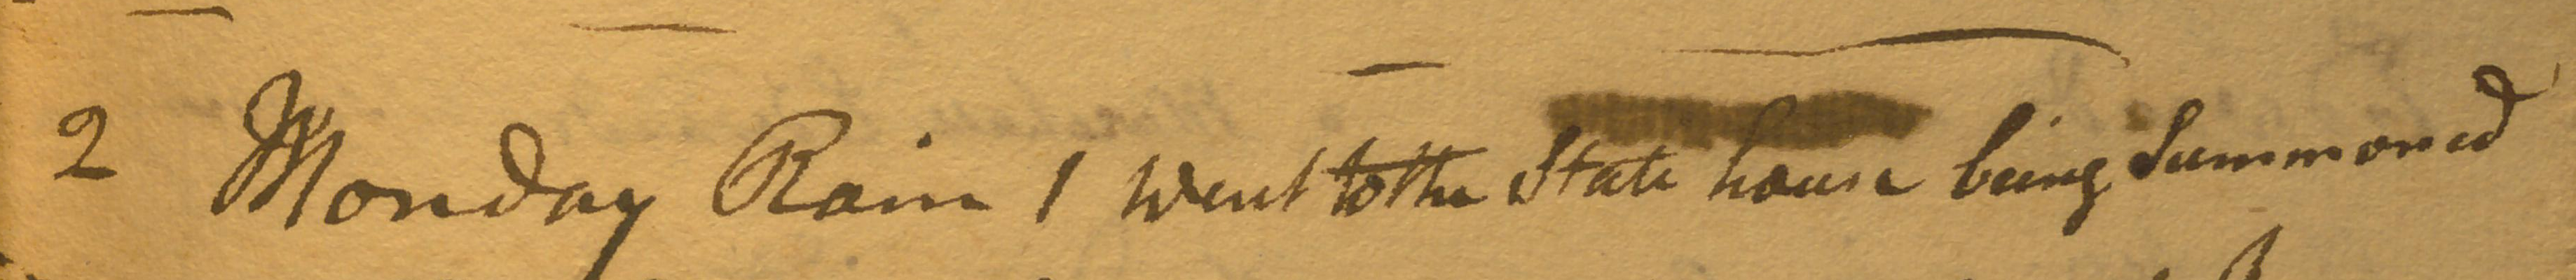2 Monday Rain 1 went to the State house being summoned
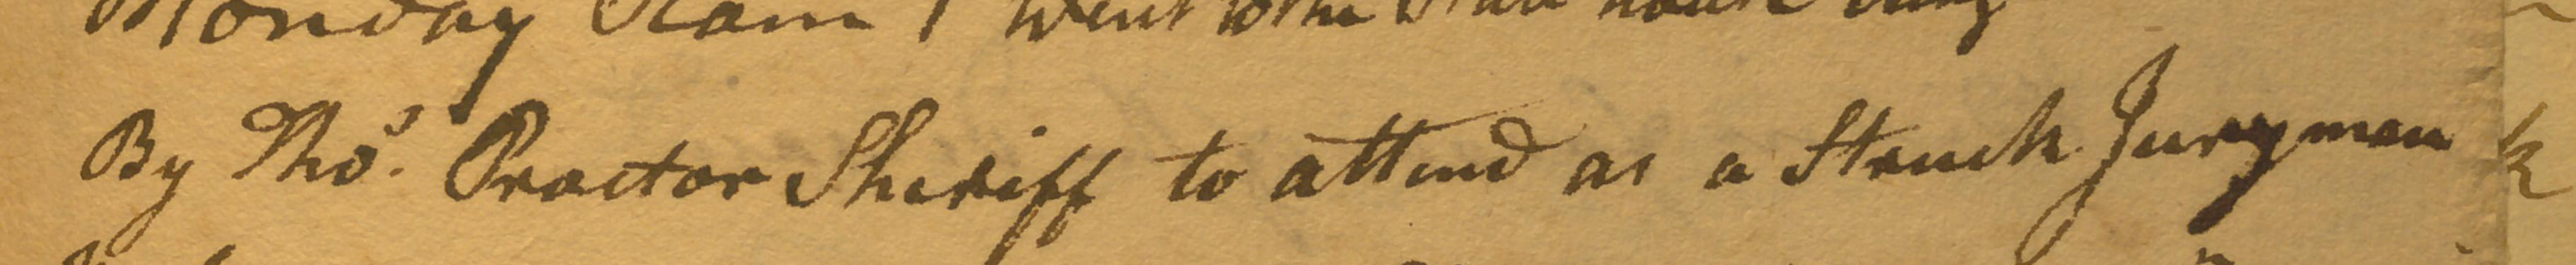By Tho^s. Proctor Sheriff to attend as a Struck Juryman
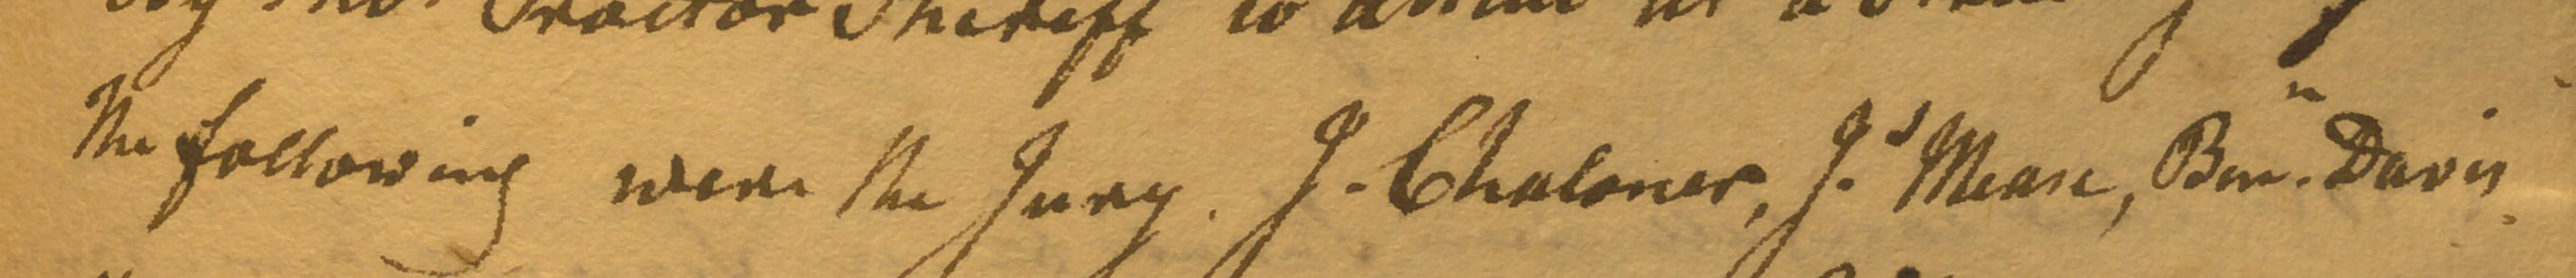the fallowing were the Jury. Jd. Chaloner J^s. Mease, Ben^n. Davis
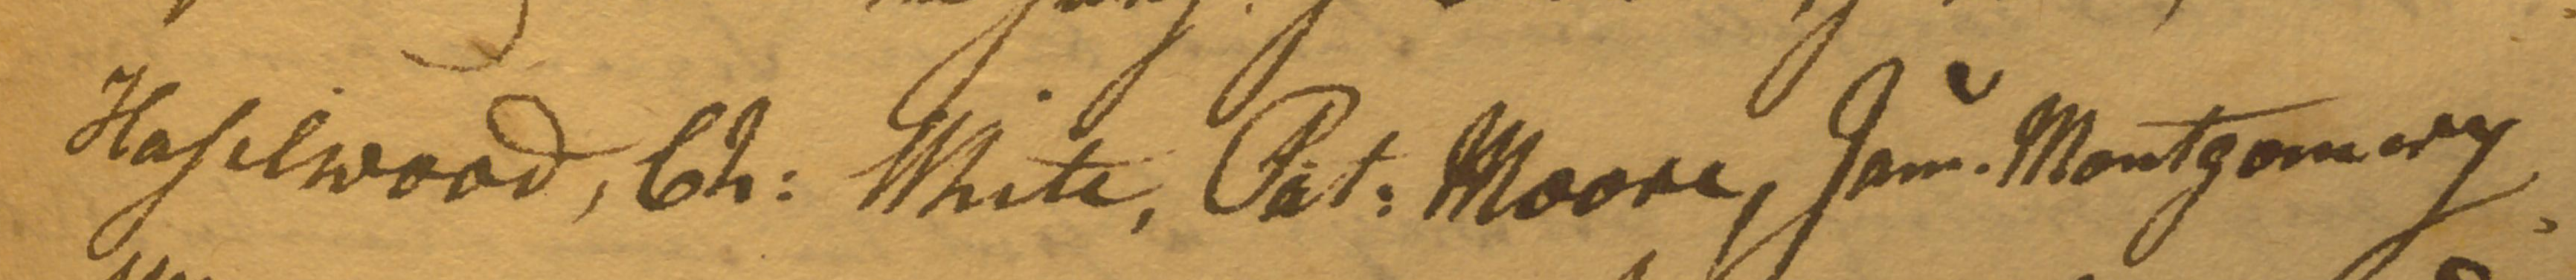Haselwood, Ch: White Pat: Moore, Jam^s. Montgomery
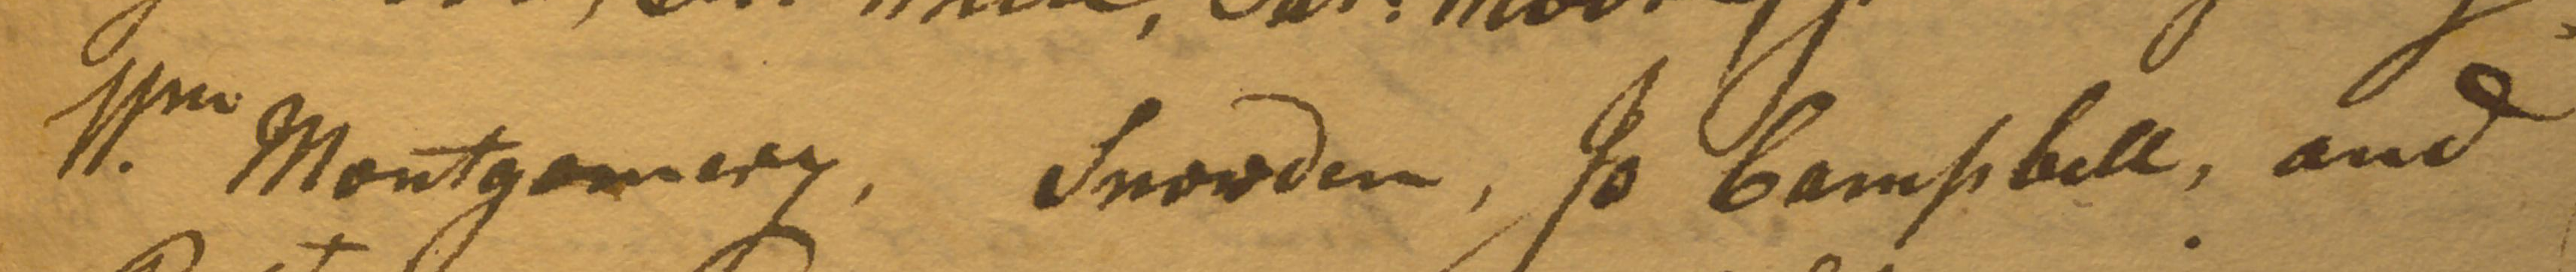W^m. Montgemery, Snowden, Jo Campbell, and
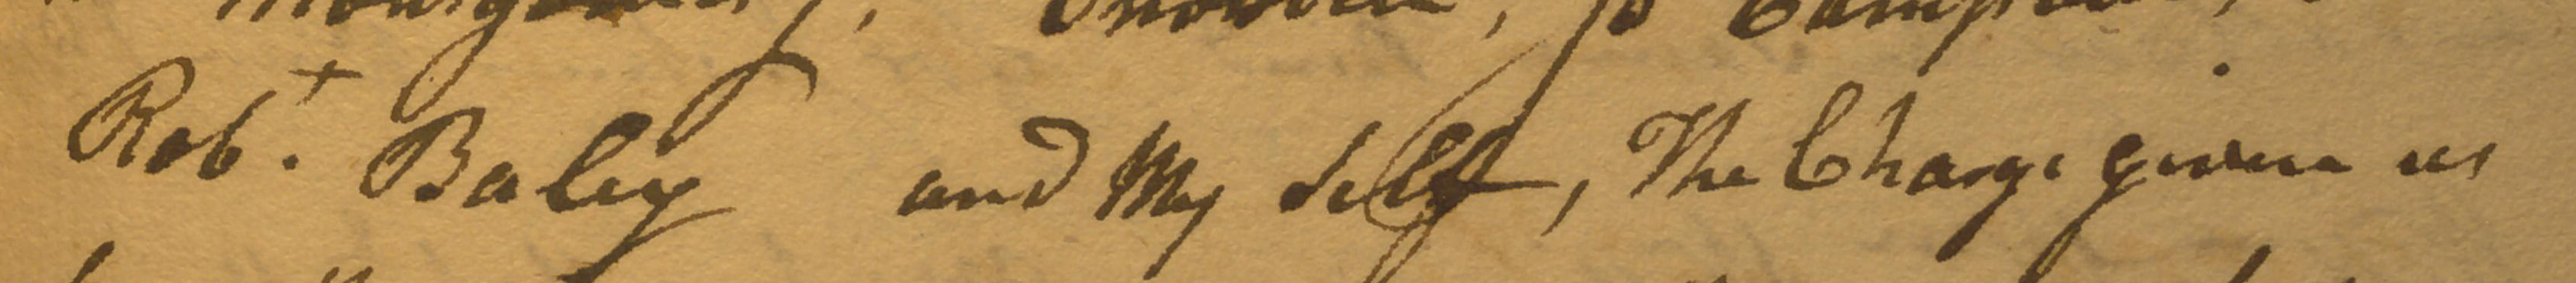Rob^t. Baley, and My self, The Charge given us
